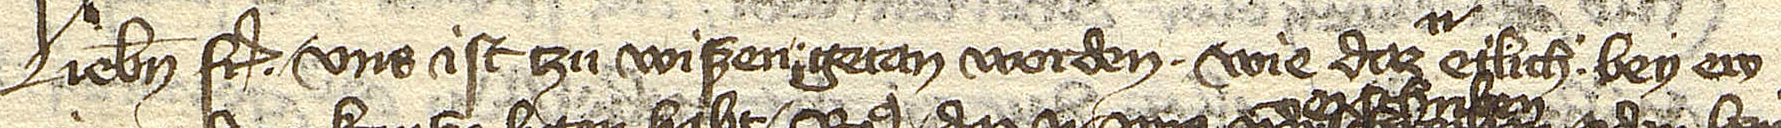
Liebn* fr* . / vns iſt cʒu wiſʒen getan worden . wie daʒ etlich bey ew
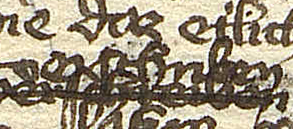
verſchriben
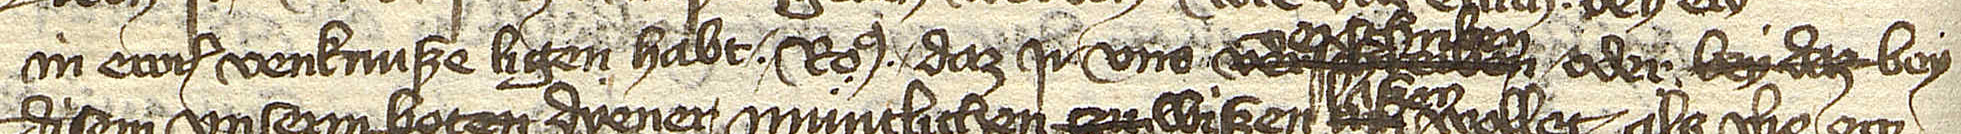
in ewr* venknuſʒe ligen habt / . Ro* . / daʒ Ir vns verſchreiben / oder bey daʒ bey
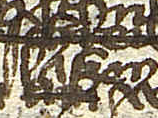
laſʒen
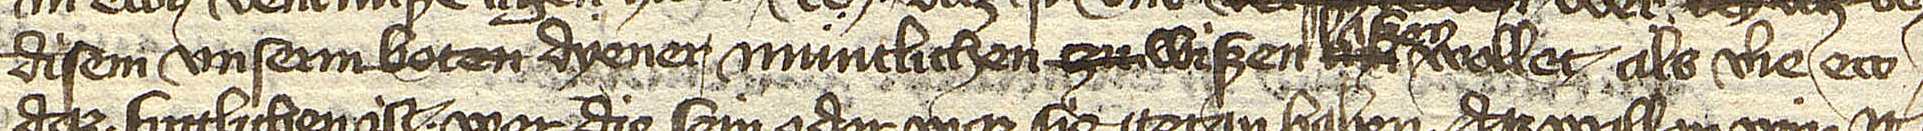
diſem vnſerm boten dyener müntlichen cʒu wiſʒen tun wollet als v*re ew
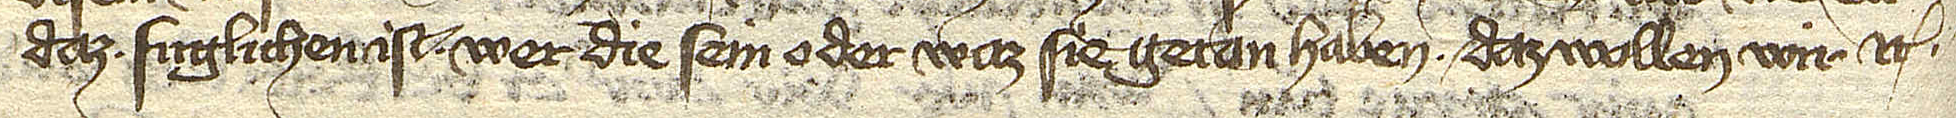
daʒ fuglichen iſt / . wer die ſein oder waʒ ſie getan haben . / daʒ wollen wir ec* .
